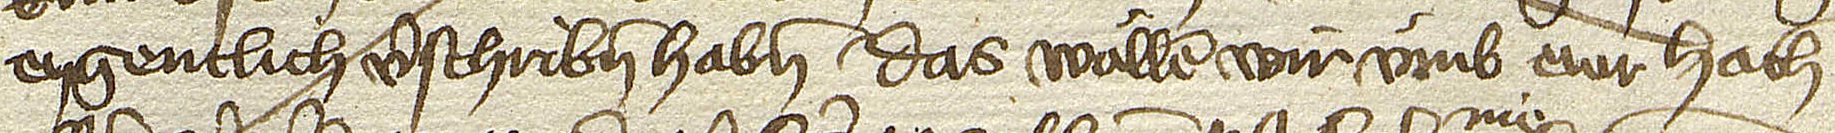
eygentlich v*ſchrib*n hab*n / das wölle* wir v̈mb ewr hoch*
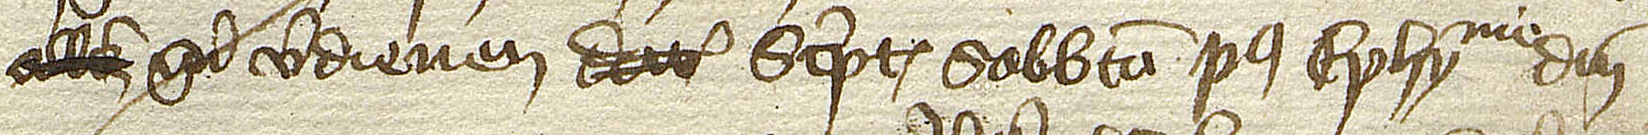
allcʒ gn* v*dienen dat* Sc*pt* Sabbta* p* Ephy* dni*
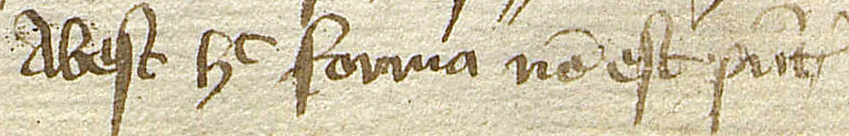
Abeſt h* forma no* eſt pnt*
